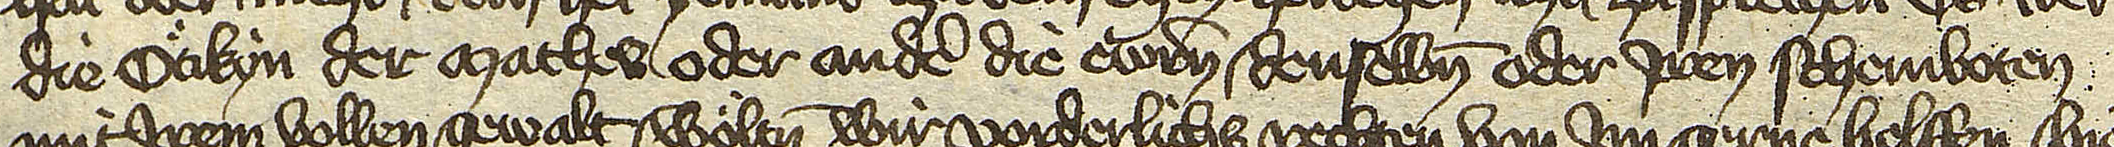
die Ötikyn der Maches oder ande* die ewrn* / denſelbn* oder Iren ſcheinboten
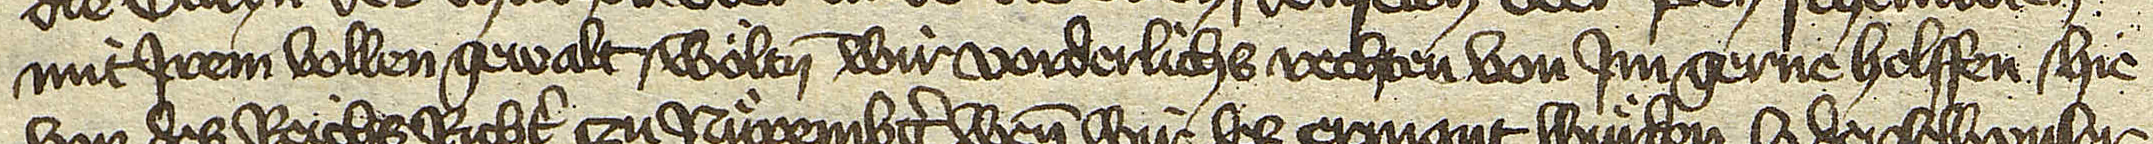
mit Irem vollen gewalt / wöltn* wir vorderlichs rechten von Im gerne helffen / hie
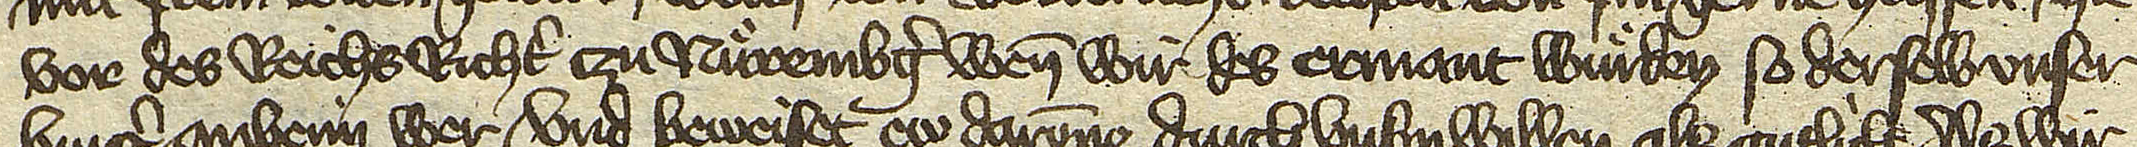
vor des Reichs Richt* cʒu Nüremb*g wen* wir des ermant würden ſo derſelb vnſer
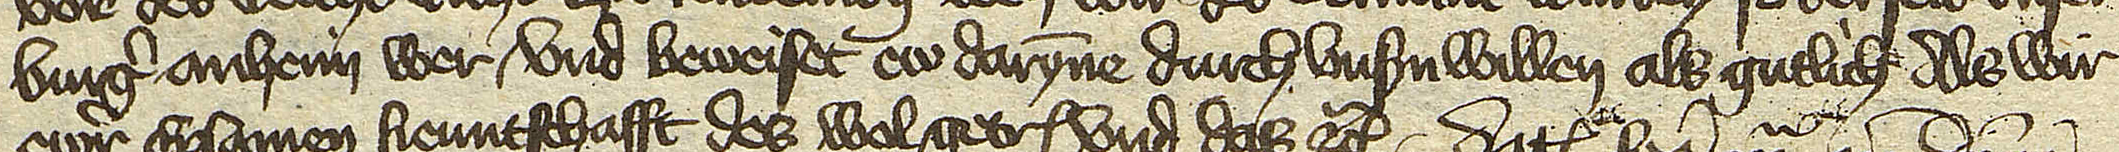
burg* anheim wer / vnd beweiſet ew daryne* durch vnſ*n willen als gutlich Als wir
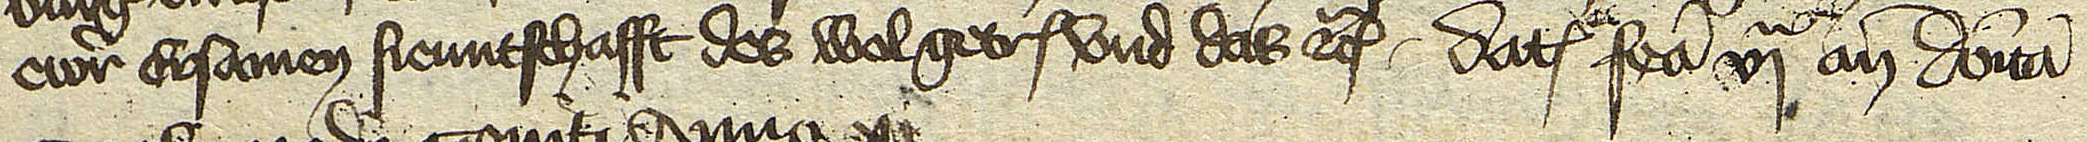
ewr* Erſamen freuntſchafft des wol getr* vnd das ec* / dat* fea* vi* an* doica*
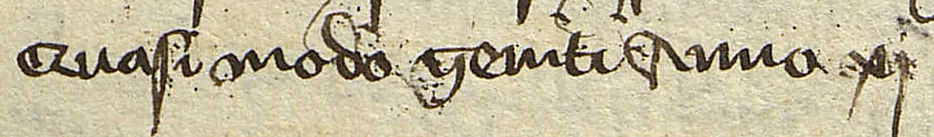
Quaſi modo geniti Anno xi
